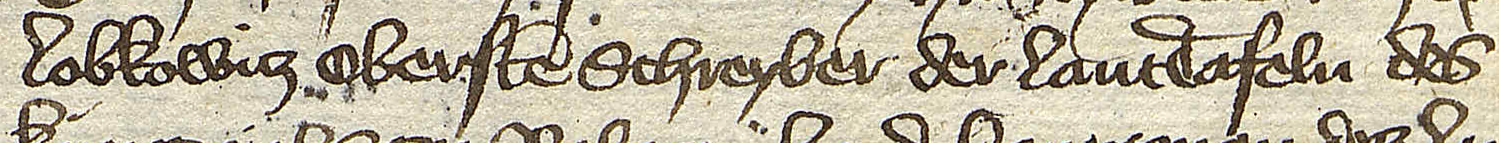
lobkowicʒ Oberſte* Schreyber der lantTafeln des
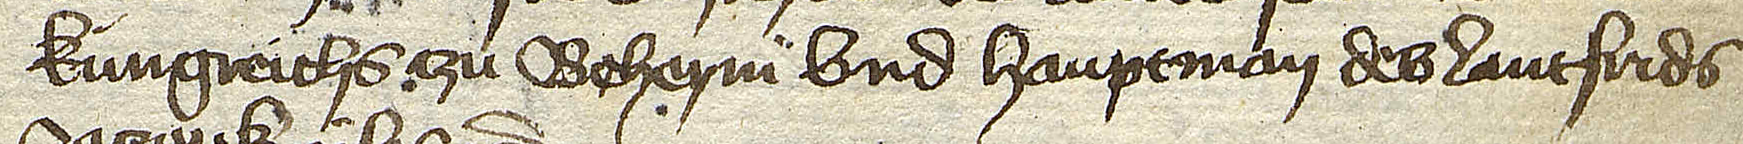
künigreichs cʒu Beheym vnd hauptman des lantfrids
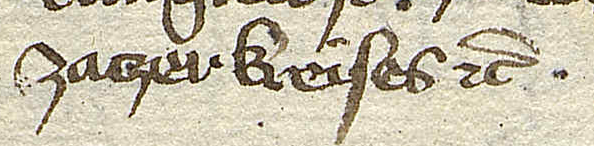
cʒacʒer kreiſes ec*
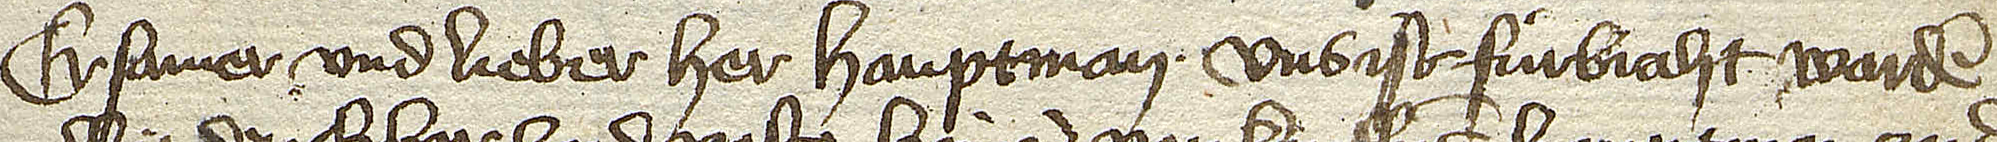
Erſamer vnd lieber her hauptman . vns iſt fürbraht worde*
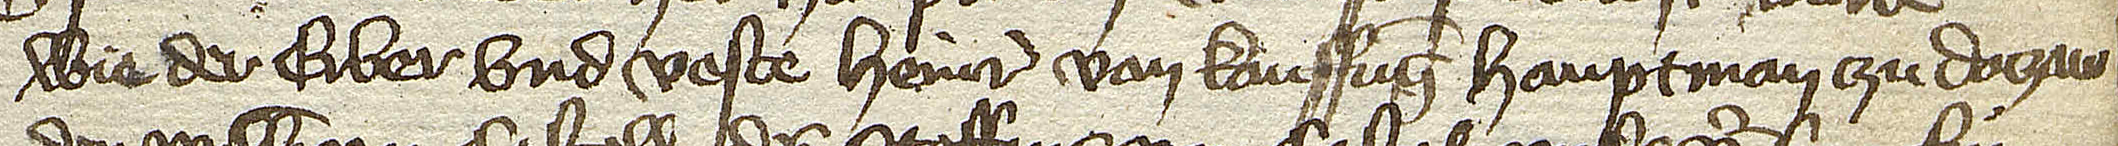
wie der Erber vnd veſte heinr* von kauffu*g hauptman cʒu dacʒaw
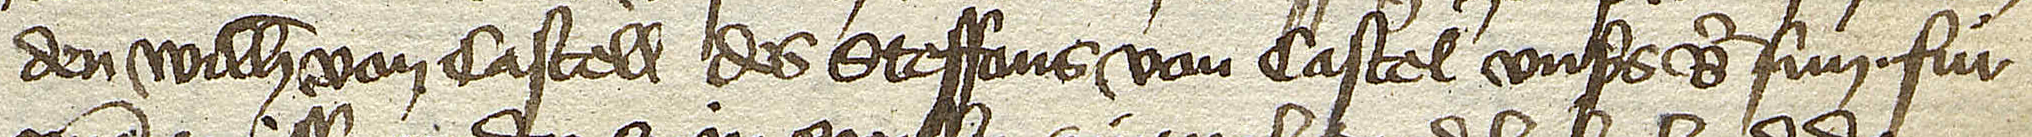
den wilh* von Caſtell des Steffans von Caſtel vnſ*s B* ſun . für
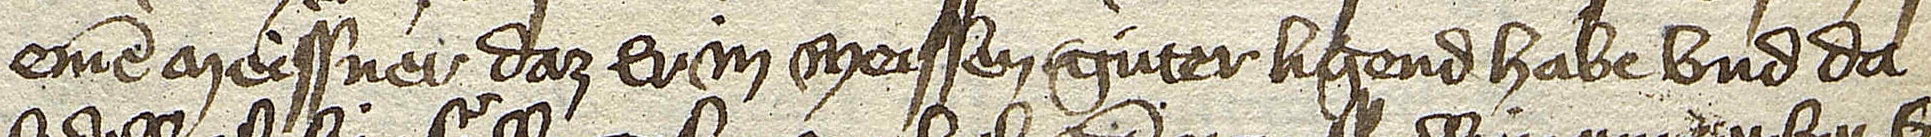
eine* Meiſſner daʒ Er in Meiſſen güter ligend habe vnd da
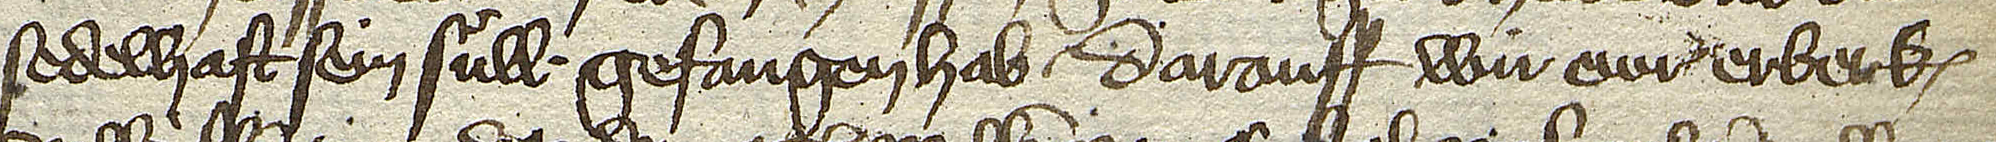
ſedelhaft ſein ſüll . gefangen hab / Darauff wir ewr* erberk*
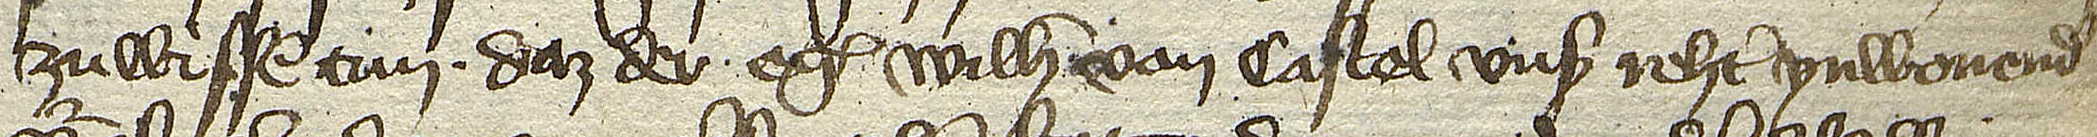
cʒu wiſſe* tun . daʒ der eg* wilh* von Caſtel vnſ* reht* ynwonend*
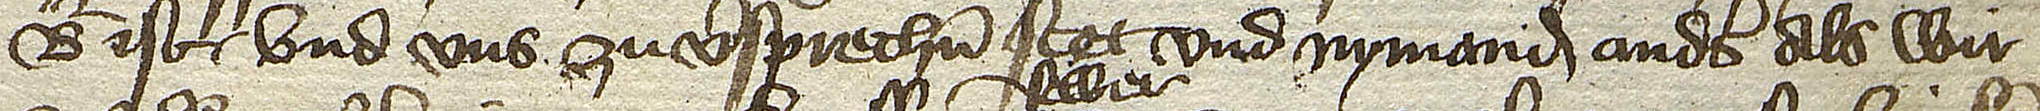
B* iſt / vnd vns cʒu v*ſprechn* ſtet vnd nymand* and*s Als wir
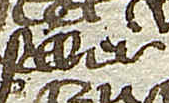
ſelber
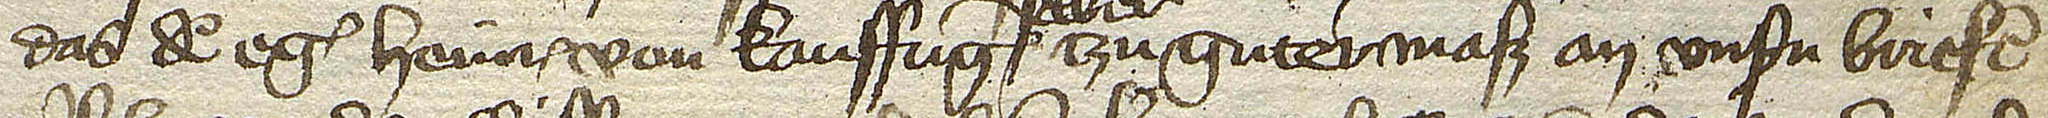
das d* eg* heinr* von kauffu*g cʒu gutermaſʒ an vnſ*n briefe*
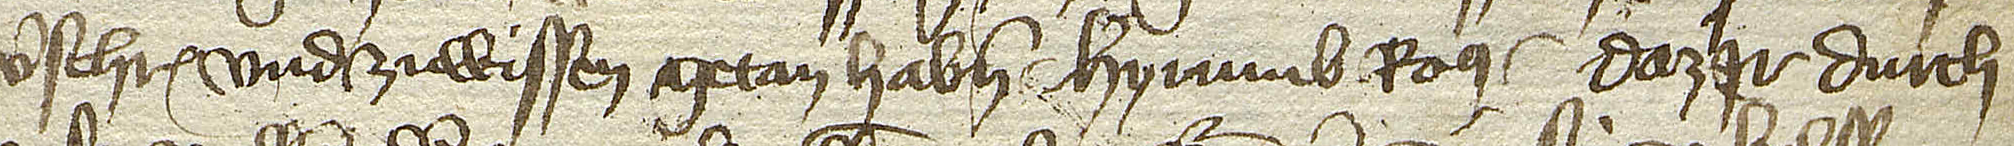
v*ſchr* vnd cʒuwiſſen getan habn* / hyrumb Ro* / daʒ Ir durch
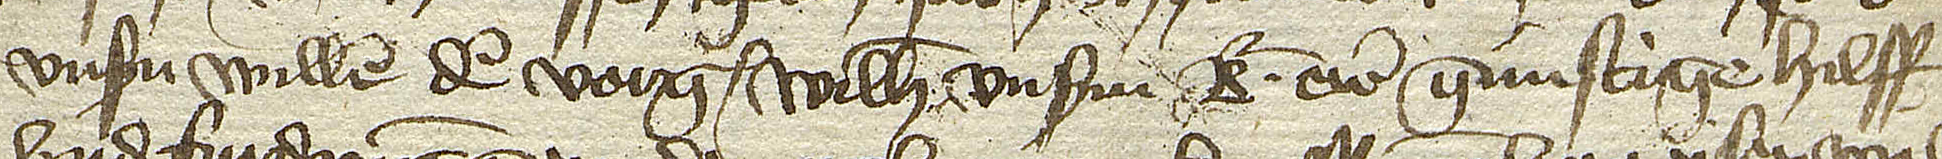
vnſ*n wille* d* vorg* wilh* vnſ*m B* . ew* günſtige hilff
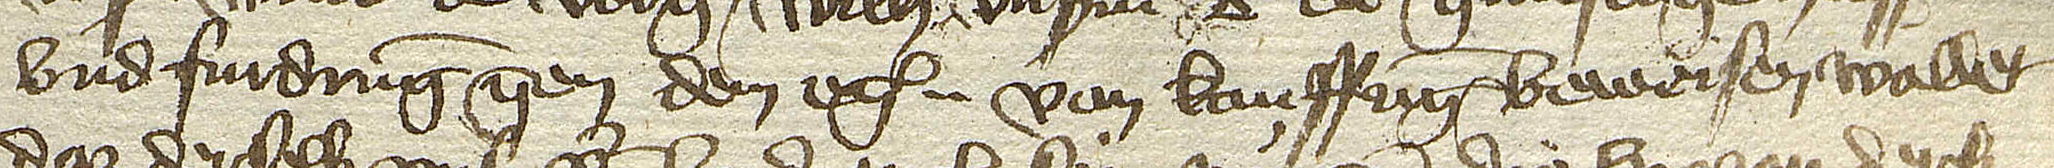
vnd furgru*g gen dem eg* ~ von kauffu*g beweiſen wöllet
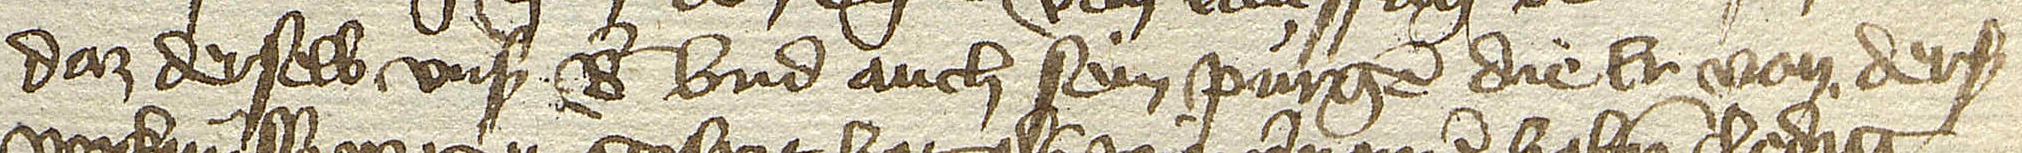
daʒ derſelb vnſ* B* vnd auch ſein pürge* die Er von derſ*
